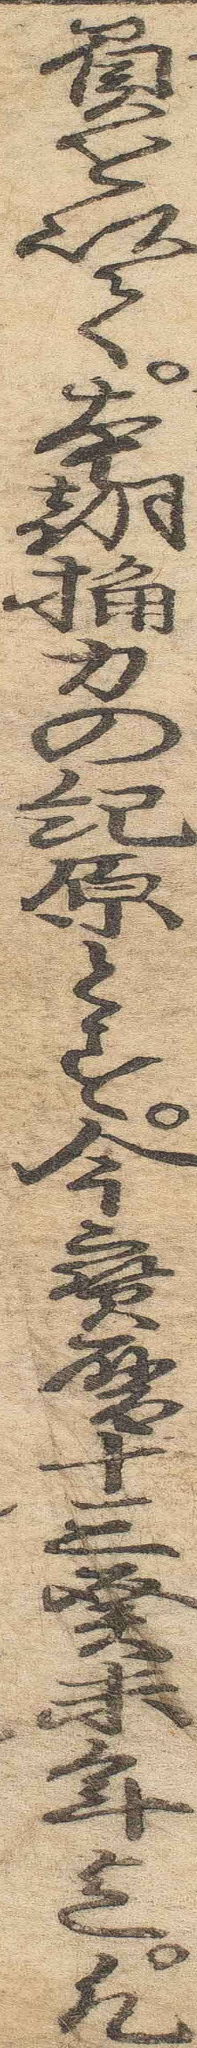負を以て。本朝捔力の紀原とす。今宝暦十三癸未年迄。凡
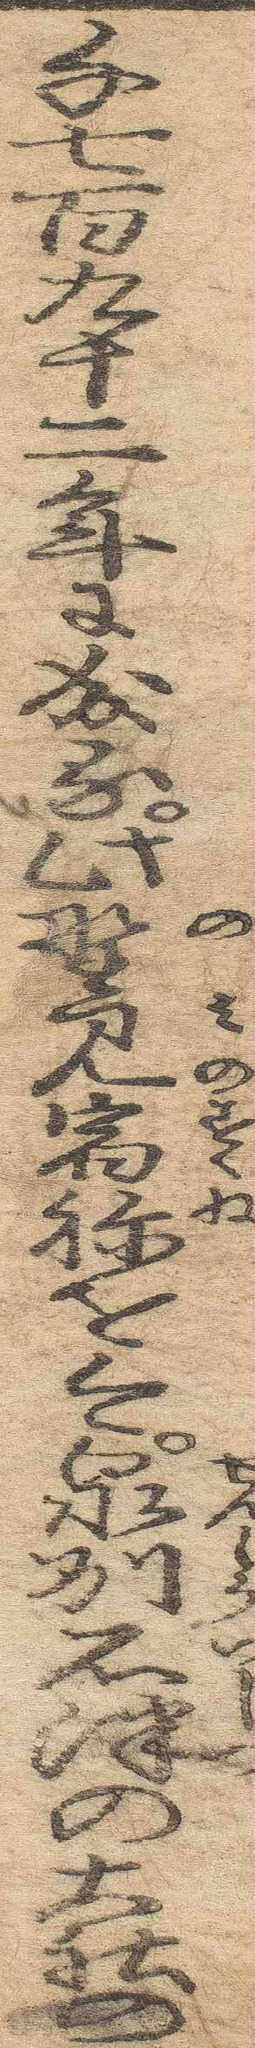千七百九十二年に成る。此野見宿祢を今。泉州石津の大社の
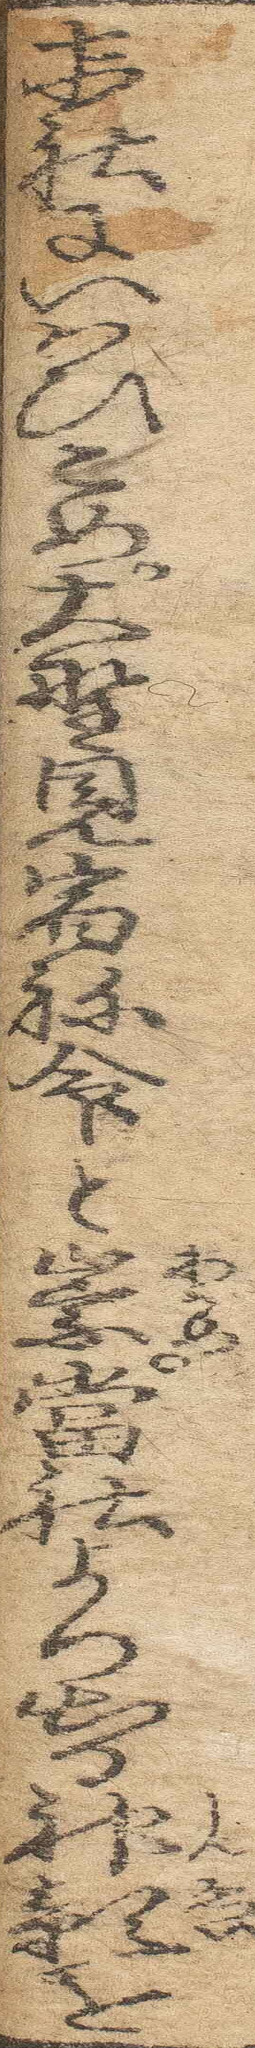末社にいはひこめ。大野見宿祢命と崇。当社より出る神影を

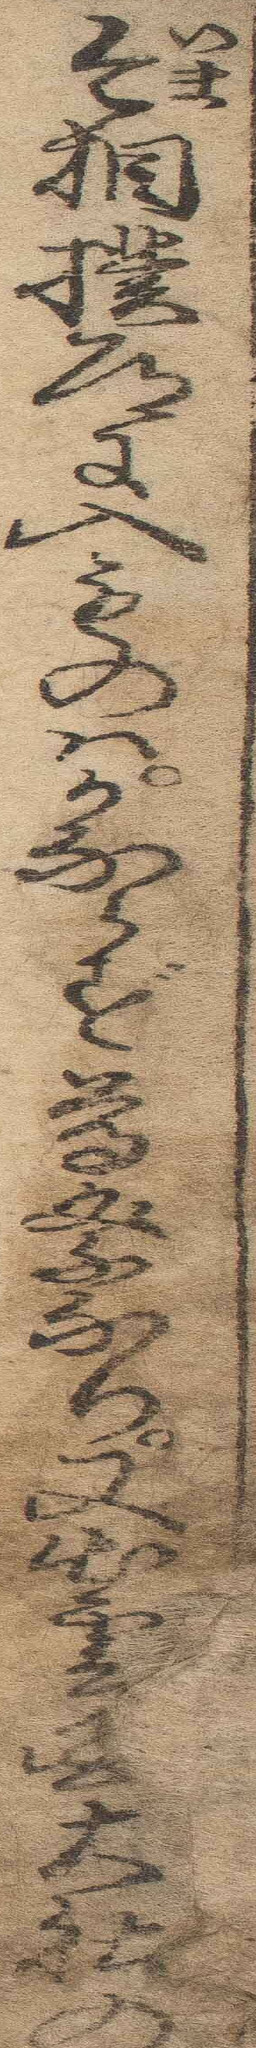今相撲道に入ものは。かならず尊祭なり。又出雲国大社の末社
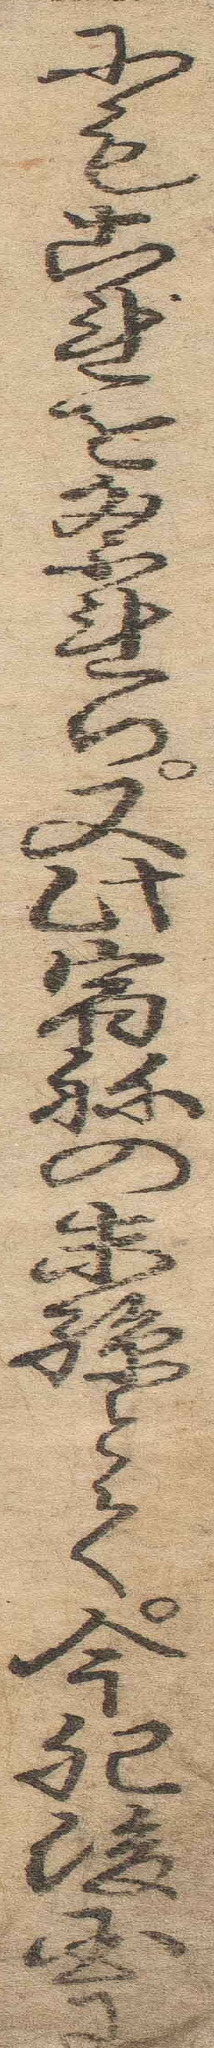にもこれを祭れり。又此宿祢の末孫とて。いま今肥後国に現
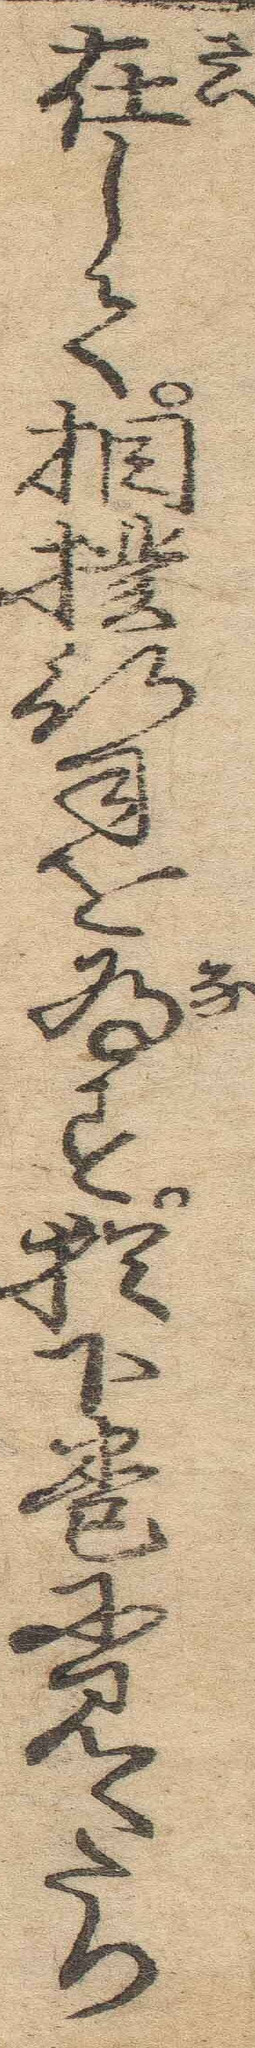在して。相撲行事を為す。猶下巻に見へたり
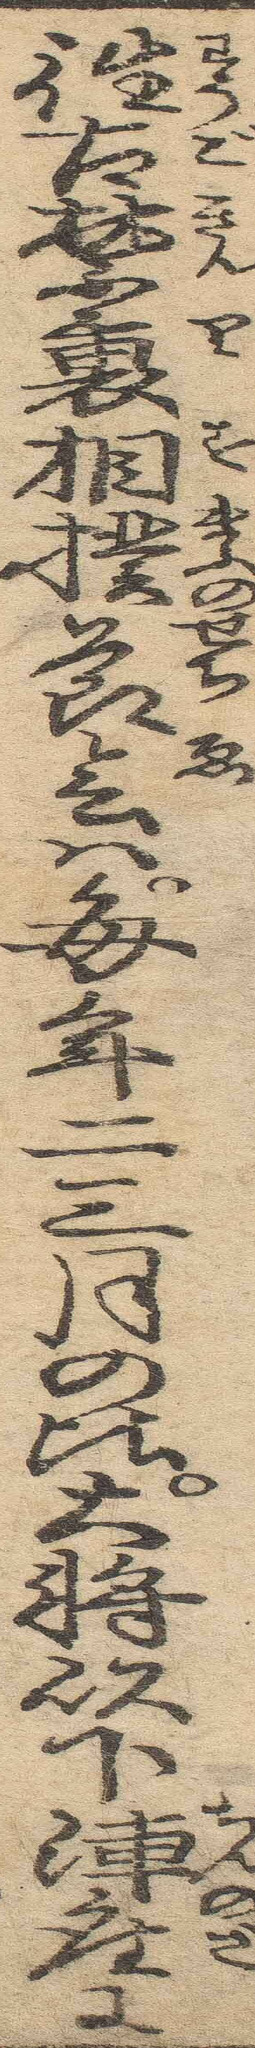往古禁裏相撲節会は。毎年二三月の比。大将以下陣座に
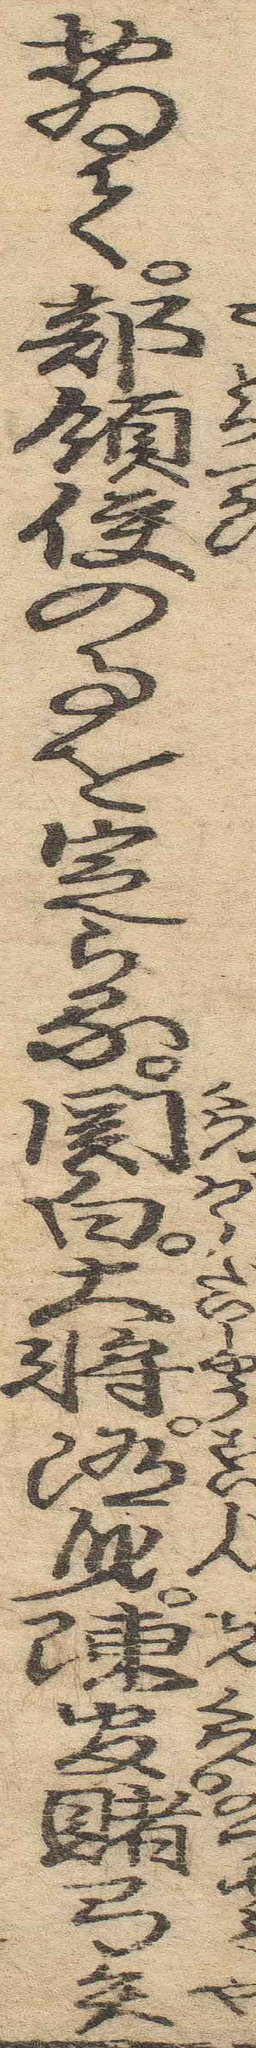おゐて。部領使の事を定らる。関白。大将。随身。陣官。賭弓矢
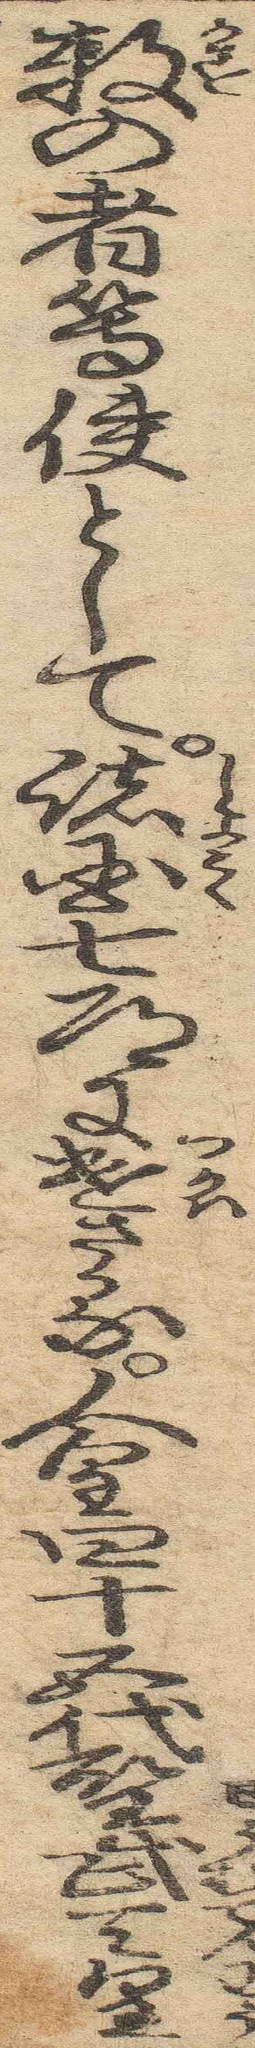数の者等使として。諸国七道に遣さる。人皇四十五代聖武天皇
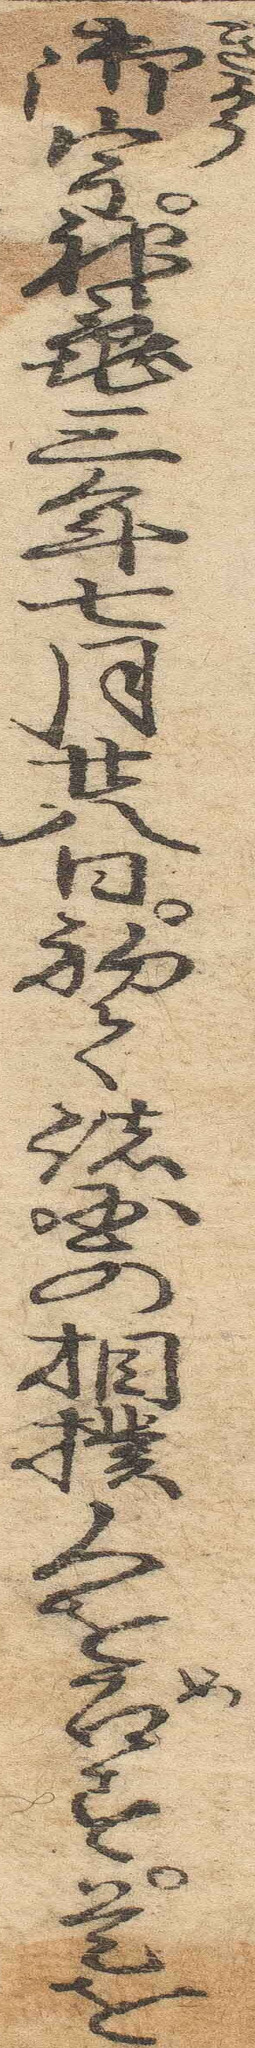御宇。神亀三年七月廿八日。初て諸国の相撲人を召す。是を
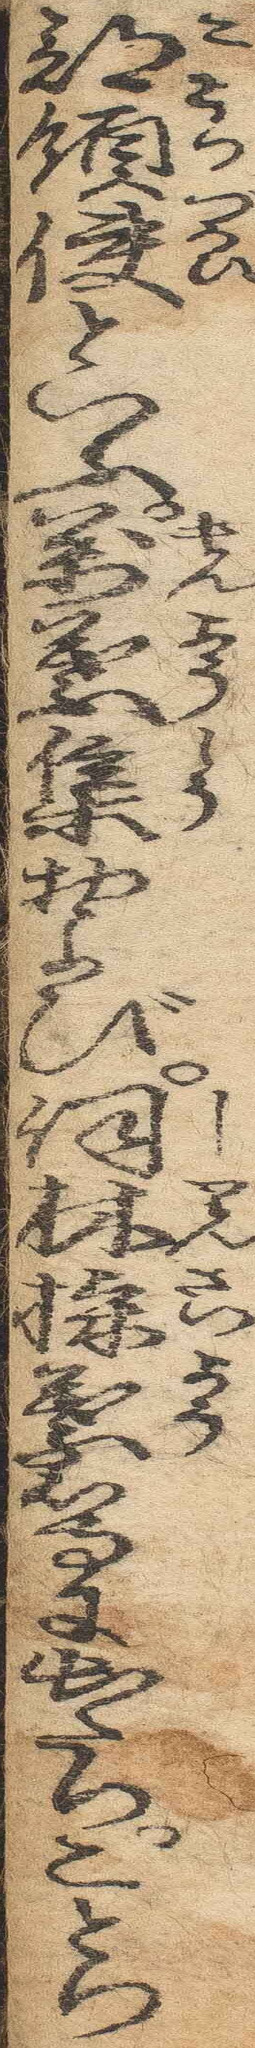部領使といふ。万葉集および。詞林採葉等に出たり。ことり
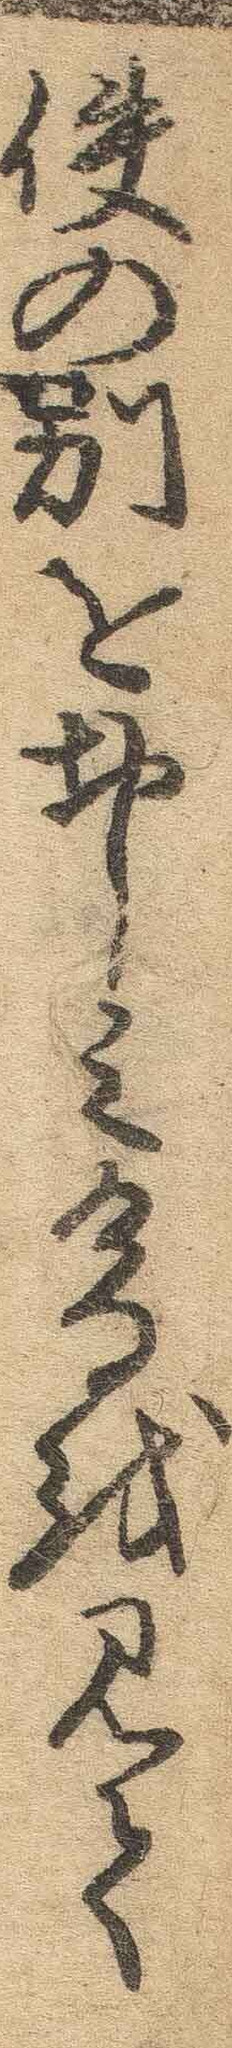使の別をおしみけるを見て
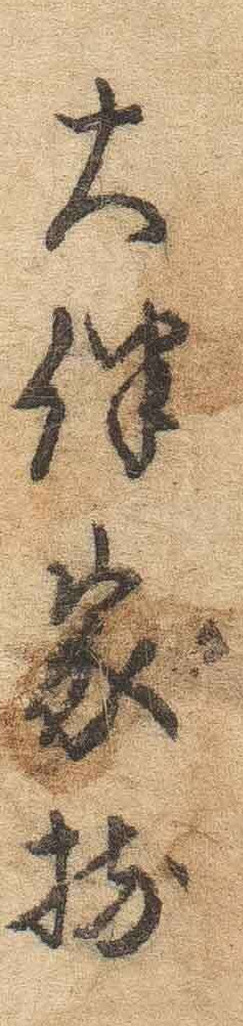大伴家持
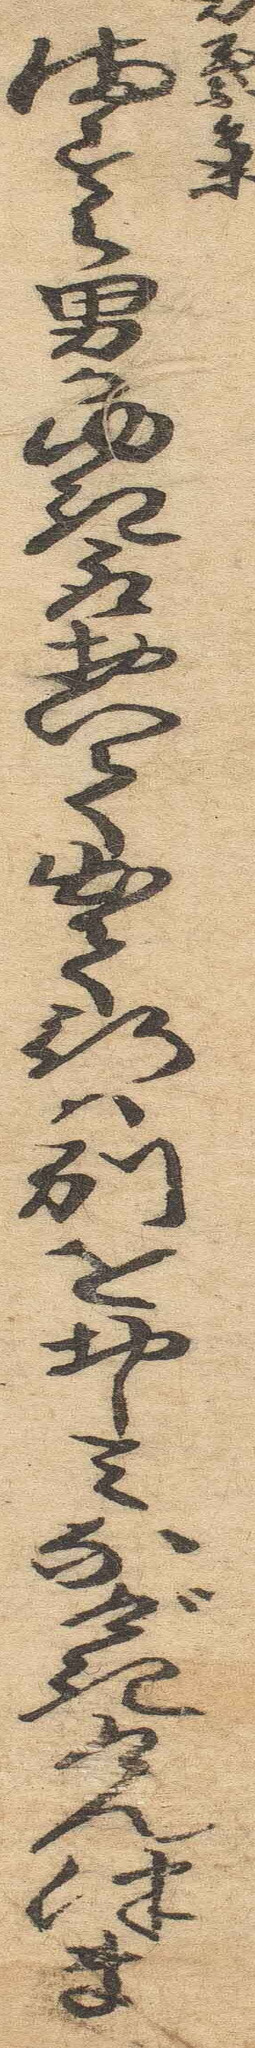ますら男かゆき取おいて出て行は別をおしみなげきけんつま
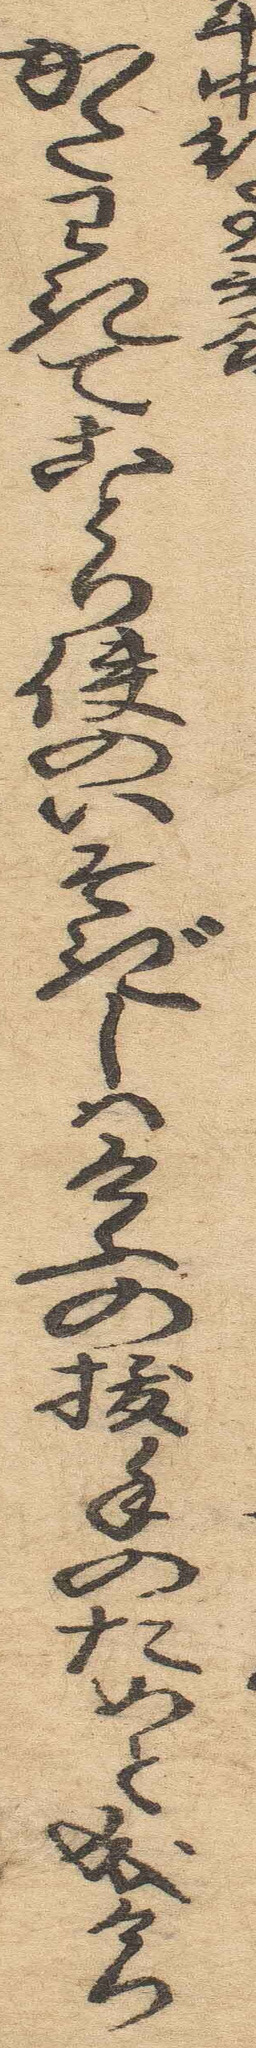かたわきてことり使のいそぎしはけふの抜手のためと成けり
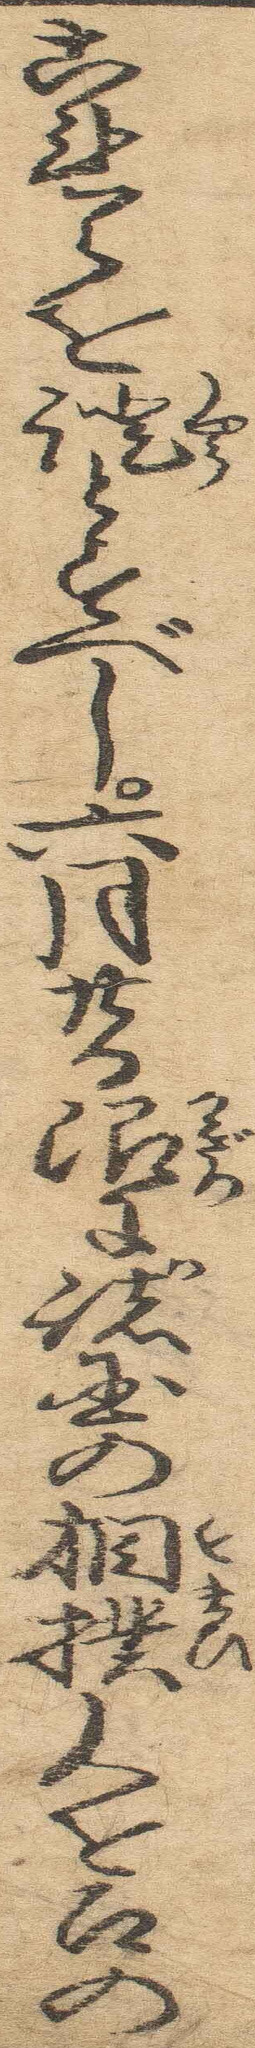これらを証とすべし。六月廿日限に。諸国の相撲人を召の
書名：古今相撲大全
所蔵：東京学芸大学附属図書館 国文学研究資料館
